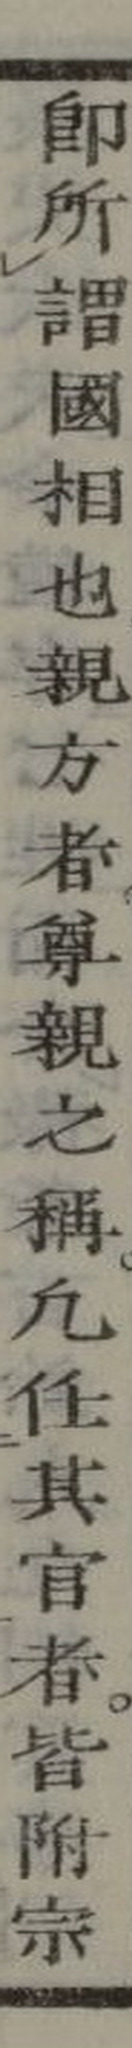卽所謂國相也。親方者。尊親之稱。凢任其官者。皆附宗
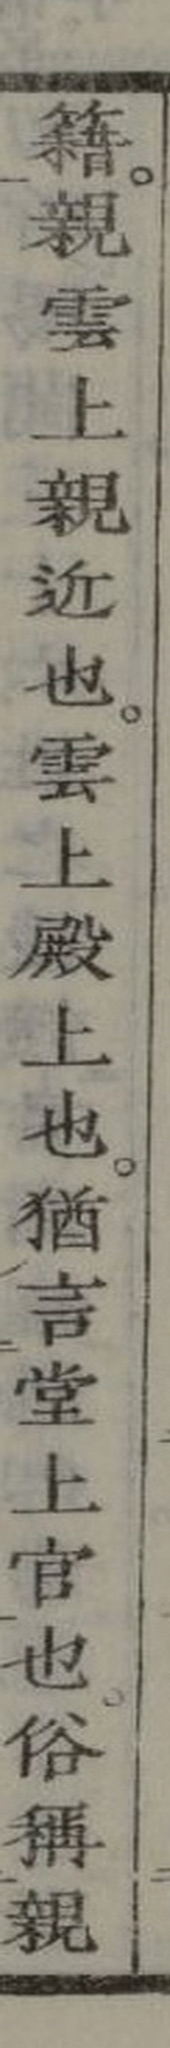籍。親雲上親近也。雲上殿上也。猶言堂上官也。俗稱親

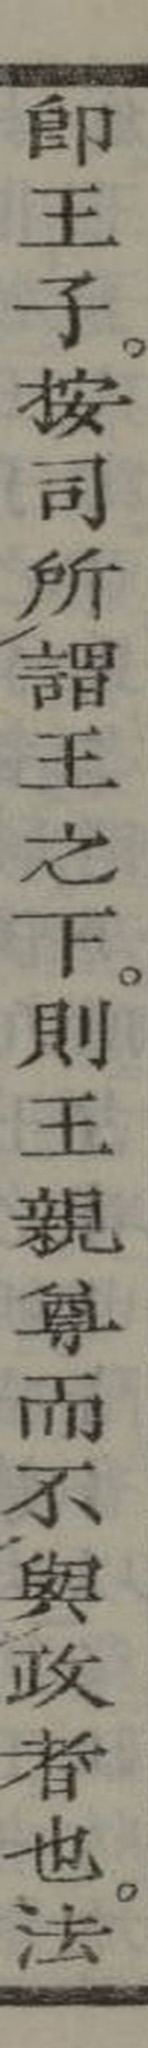卽王子。按司所謂王之下。則王親尊而不與政者也。法
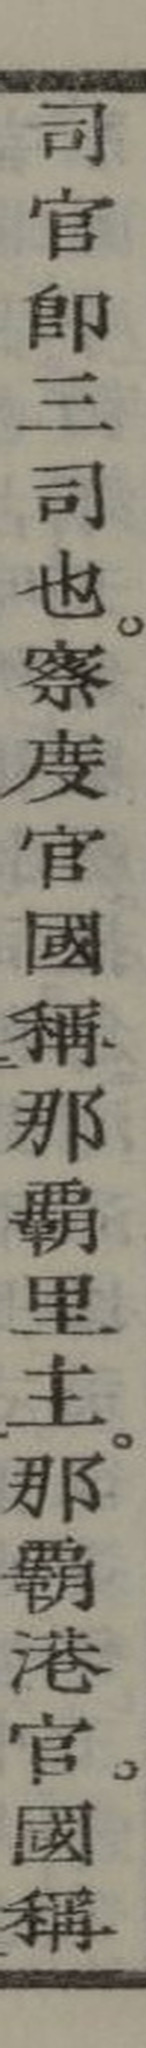司官卽三司也。察度官國稱那覇里主。那覇港官。國稱
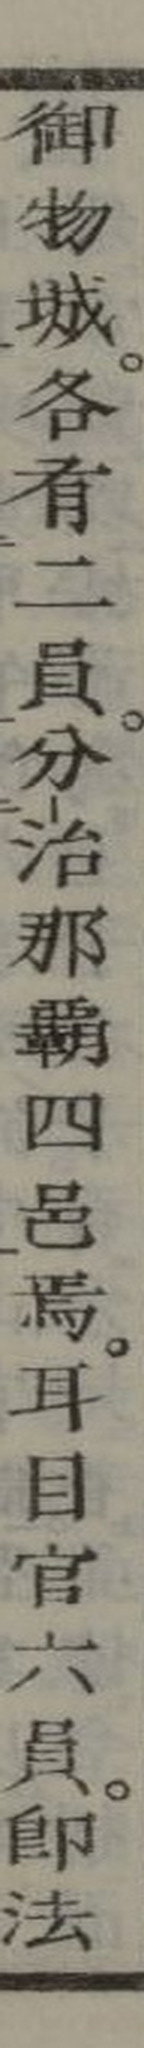御物城。各有二員。分-治那覇四邑焉。耳目官六員。卽法
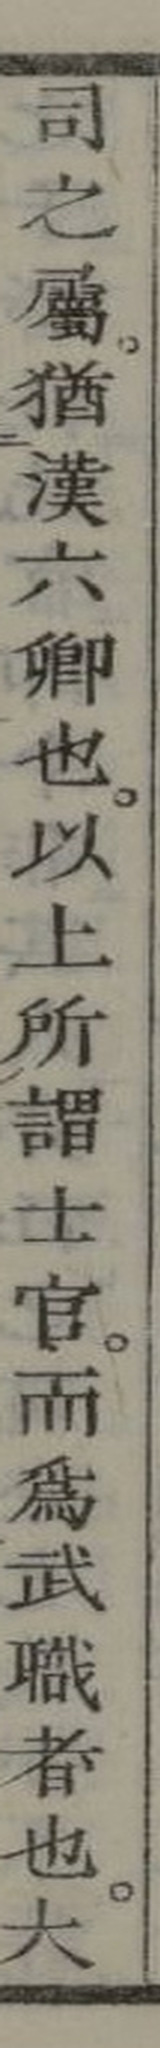司之屬。猶漢六卿也。以上所謂士官。而爲武職者也。大
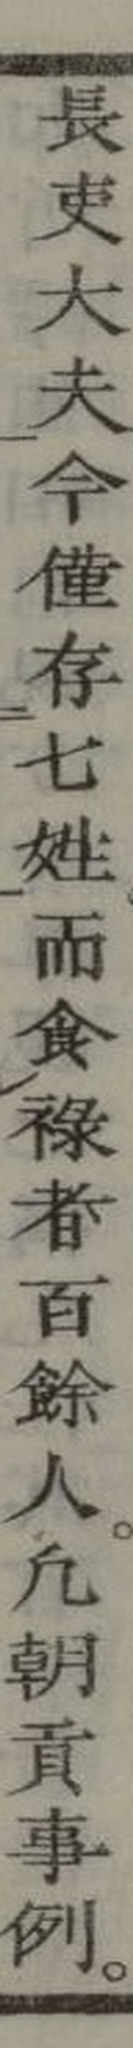長吏大夫。令僅存七姓。而食禄者百餘人。凢朝貢事例。
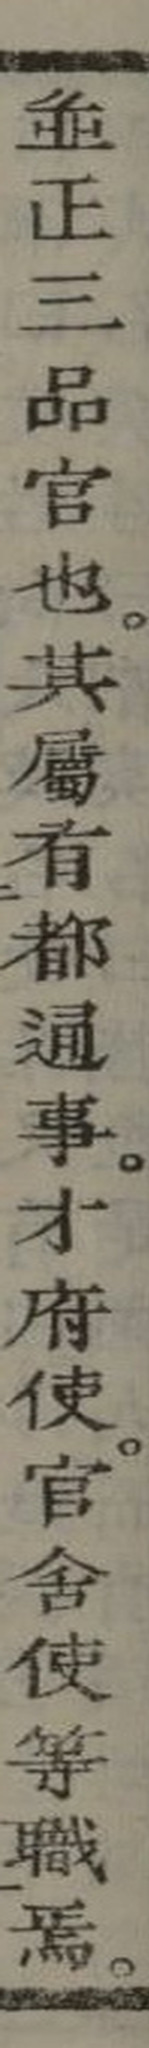並正三品官也。其屬有都通事。才府使。官舎使等職焉。
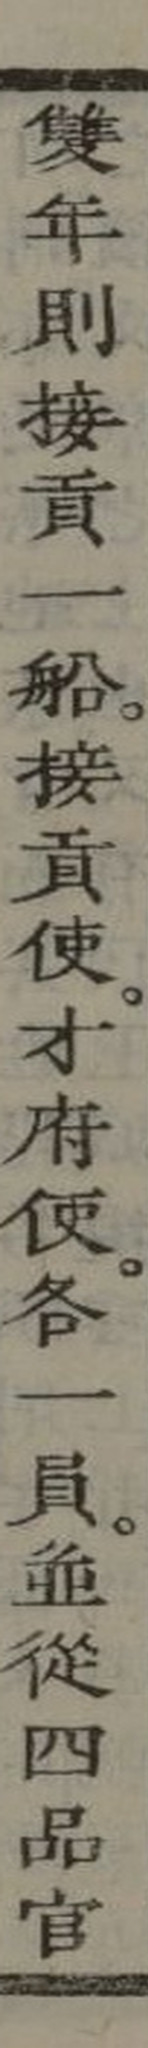雙年則接貢一船。接貢使。才府使。各一員。並從四品官
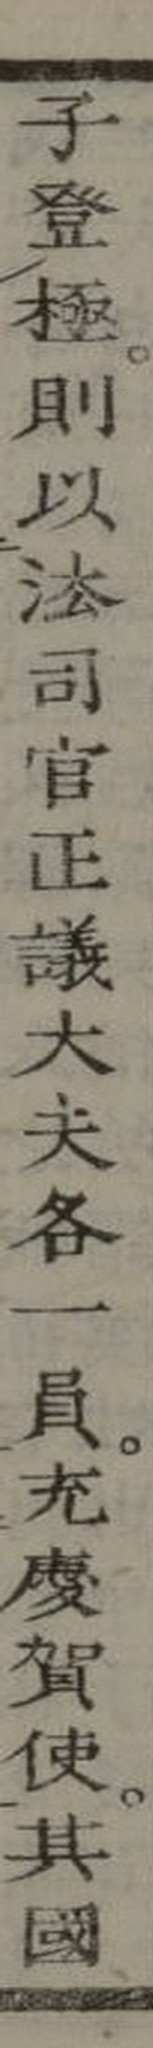子登極。則以㳒司官正議大夫各一員。充慶賀使。其國
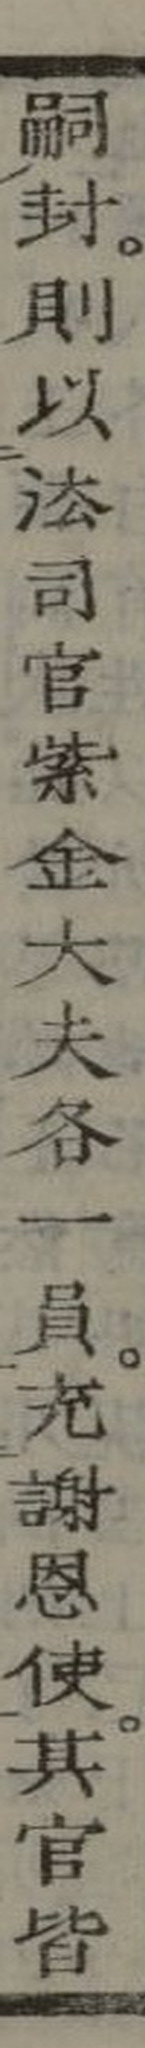嗣封。則以㳒司官紫金大夫各一員。充謝恩使。其官皆
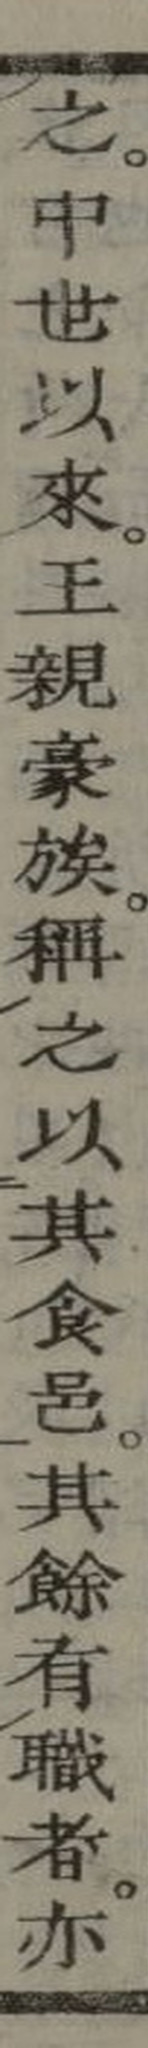之。中世以來。王親豪族。稱之以其食邑。其餘有職者。亦

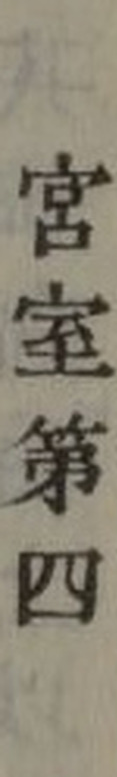宮室第四
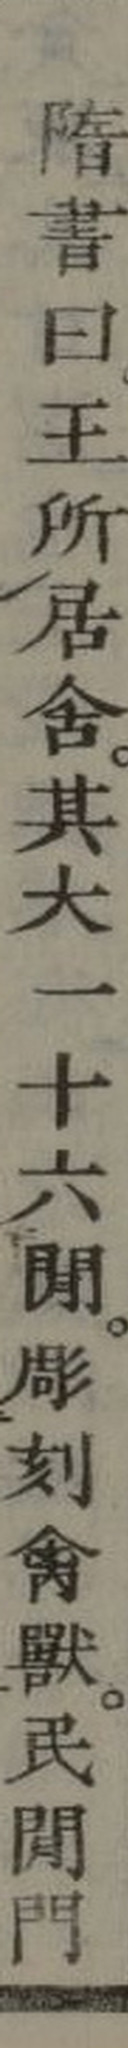隋書曰。王所居舎。其大一十六閒。彫刻禽獸。民閒門
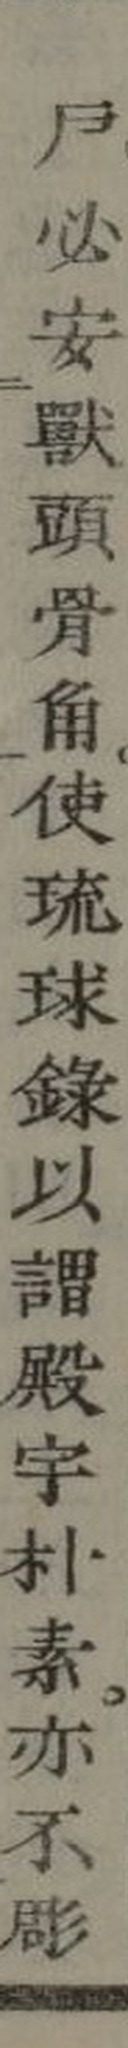戸。必安獸頭骨角。使琉球錄以謂殿宇朴素。亦不彫
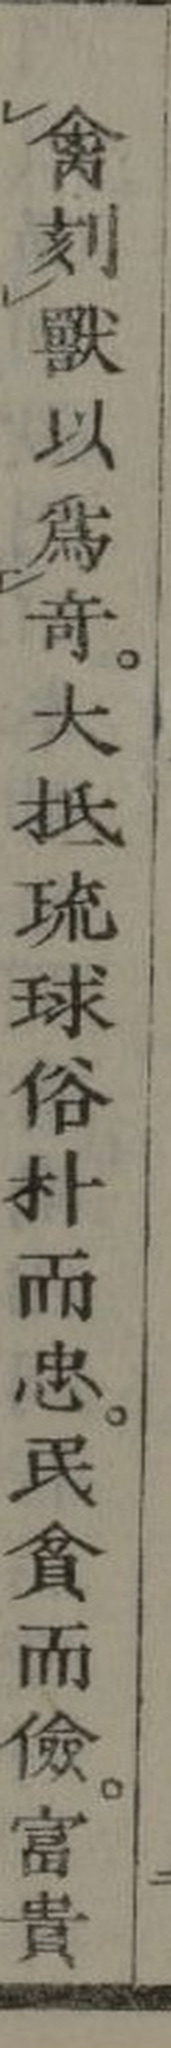禽刻獸以爲レ竒。大抵琉球俗朴而忠。民貧而儉。富貴
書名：南島志 呂
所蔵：University of the Ryukyus Library
